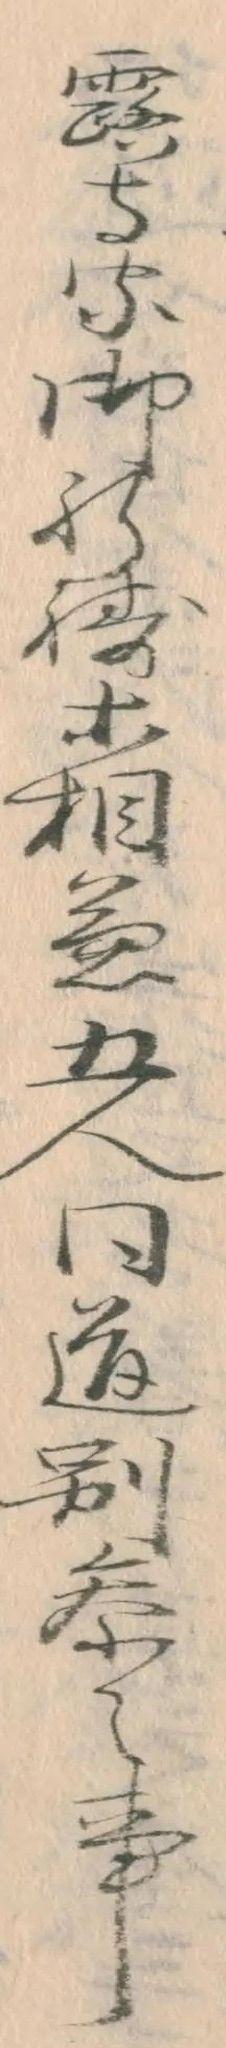露寺家御祈祷等相兼五人同道別参之事
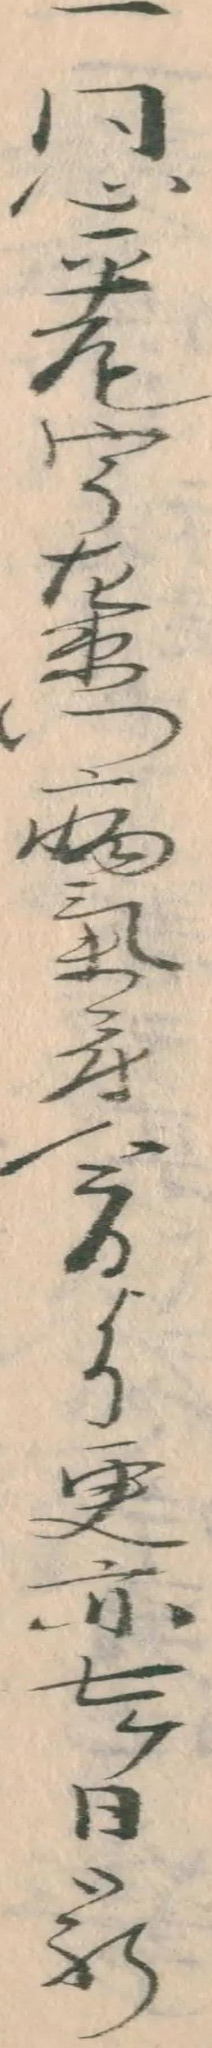一同心平尾宇左衛門病氣ニ付今日より更亦七ケ日御祈
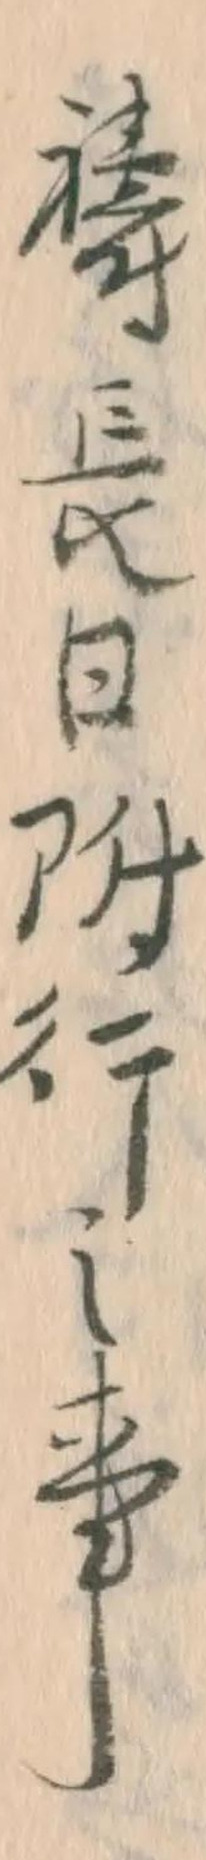祷長日附行之事
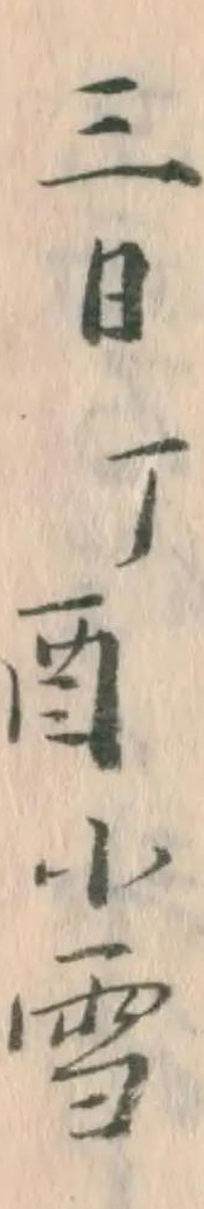三日丁酉小雪
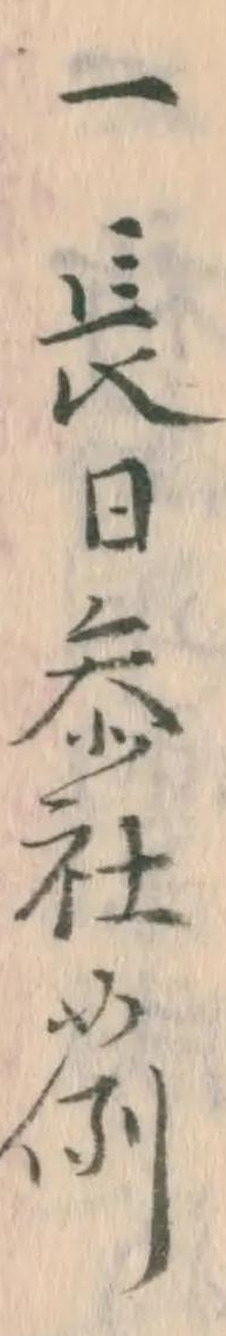一長日参社如例
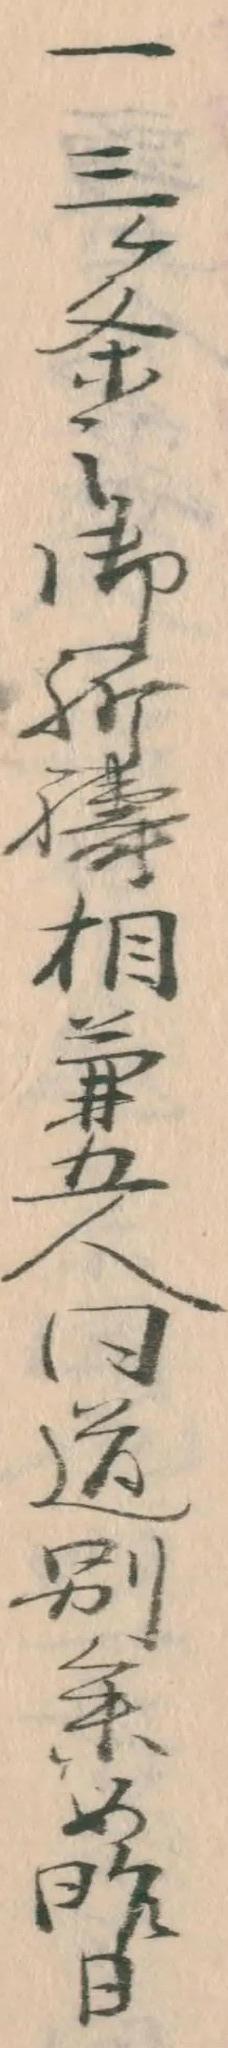一三ケ条之御祈祷相兼五人同道別参如昨日
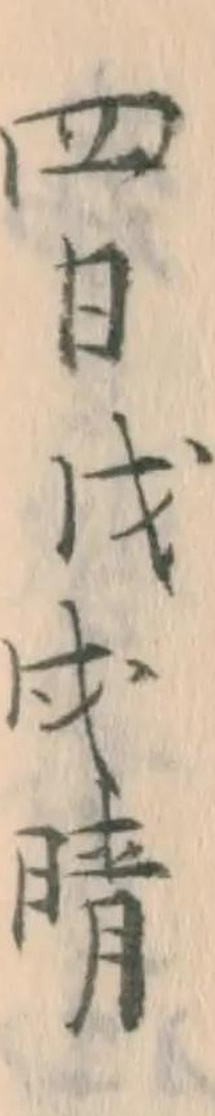四日戊戌晴
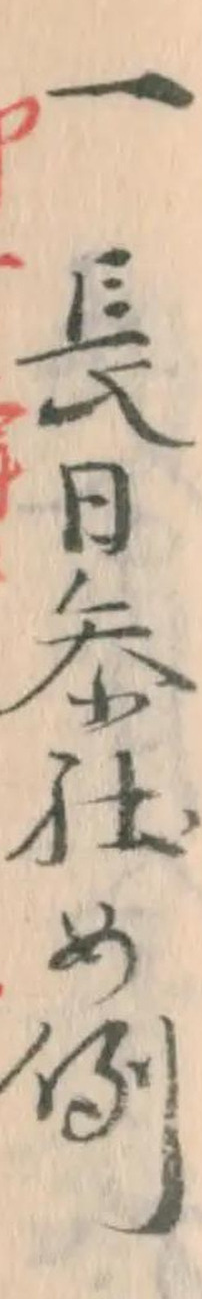一長日参社如例
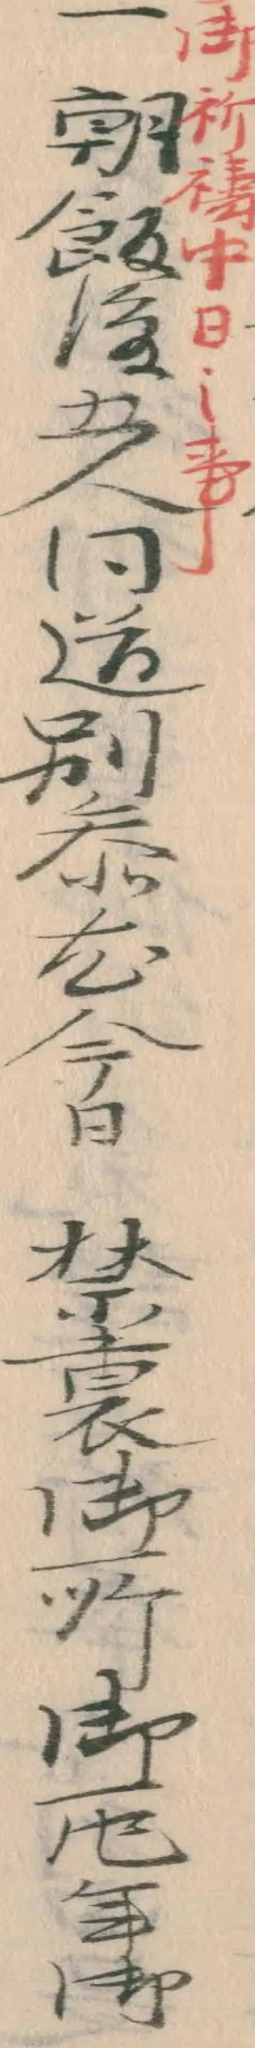一朝飯後五人同道別参尤今日禁裏御所御厄年御
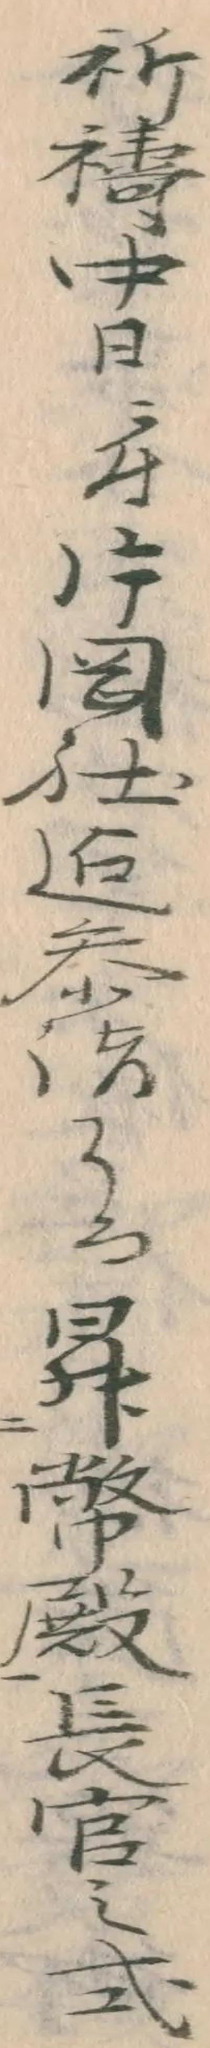祈祷中日ニ付片岡社迄参詣了而昇幣殿長官之式
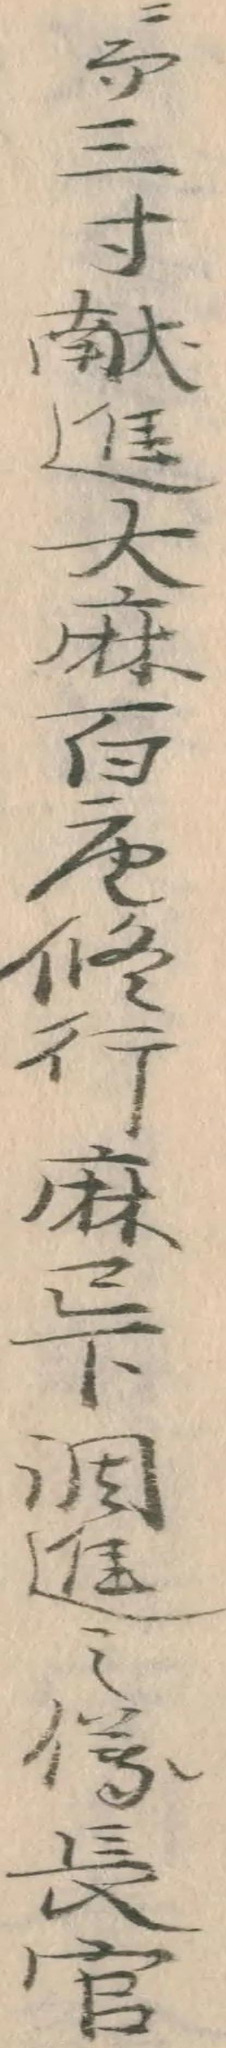ニ而三寸献進大麻百座修行麻已下調進之儀長官
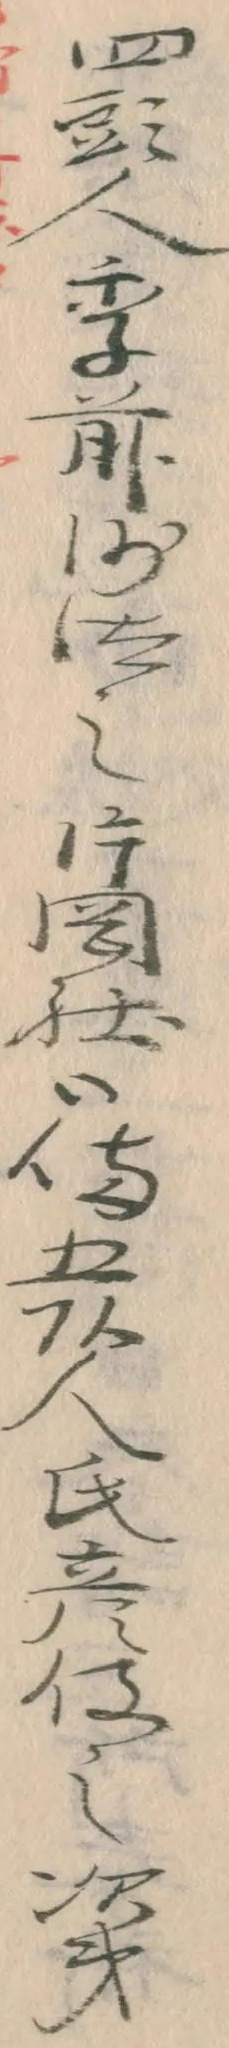四頭人季前沙汰之片岡社御備五頭人氏産役之次第
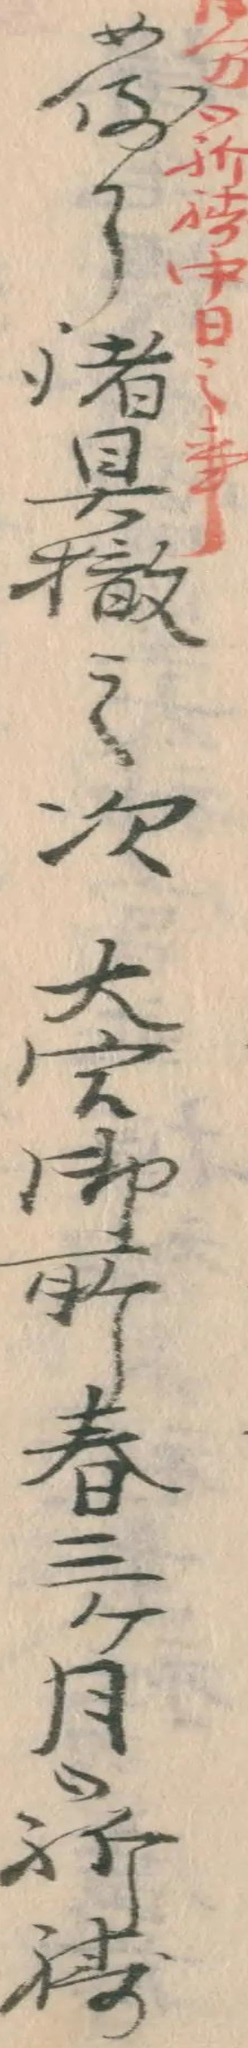如例了諸具撒之次大宮御所春三ヶ月御祈祷
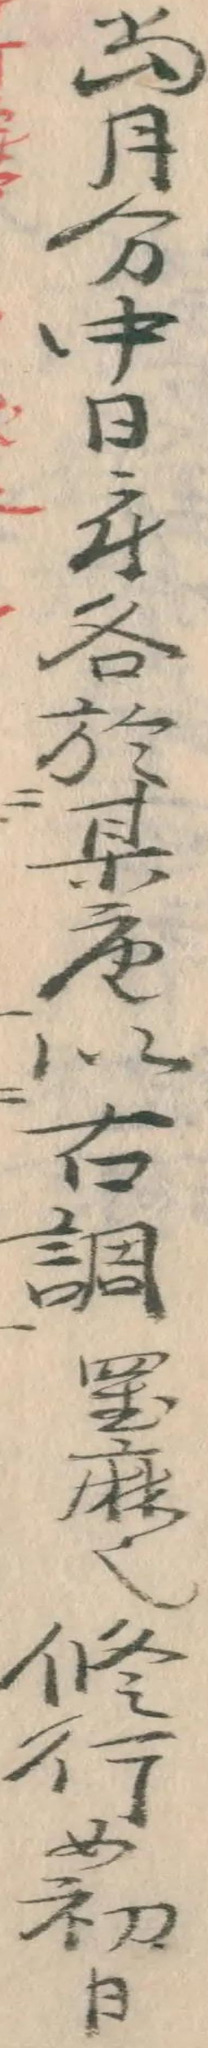當月分中日ニ付各於某唐以古調置麻也修行如初日
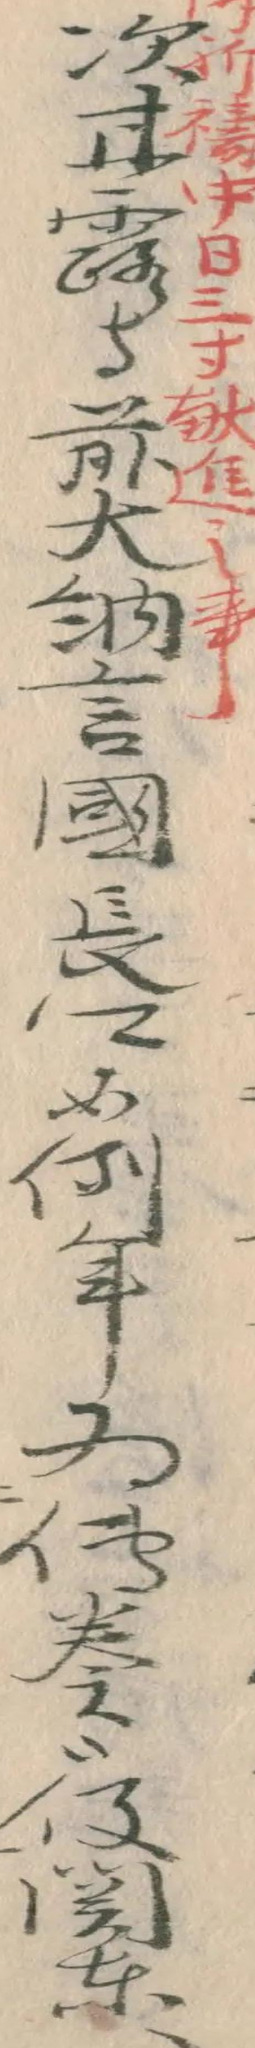次甘露守前大納言國長卿如例年為傳奏御役関東へ
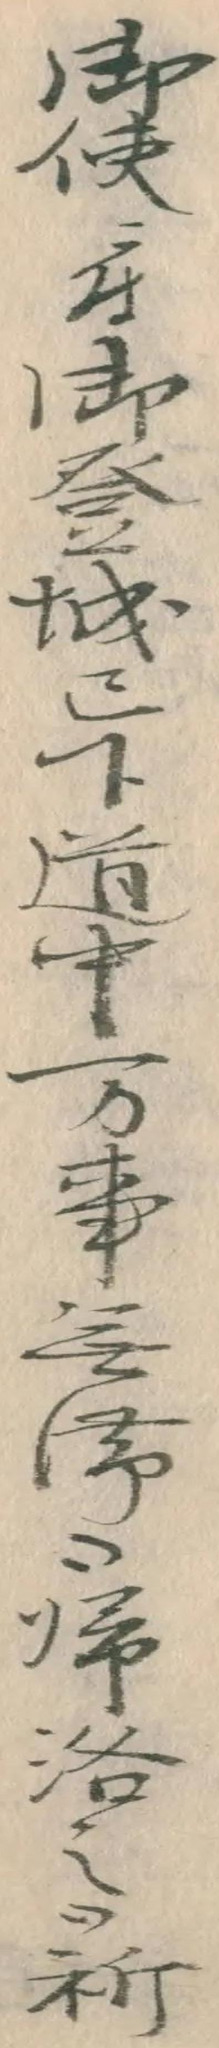御使ニ付御登城已下道中万事無滞御帰洛之御祈
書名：賀茂社記録. 第72冊
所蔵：国立国会図書館 National Diet Library, JAPAN
